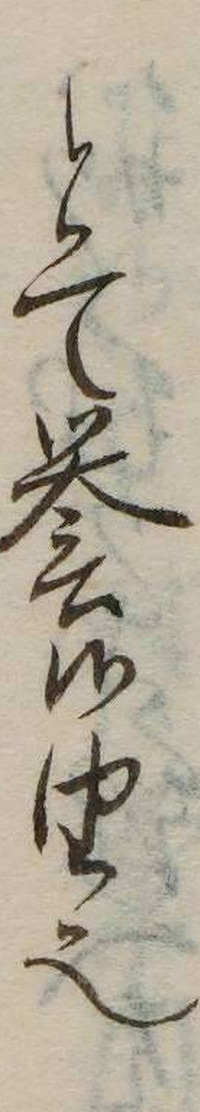とて誉候由也
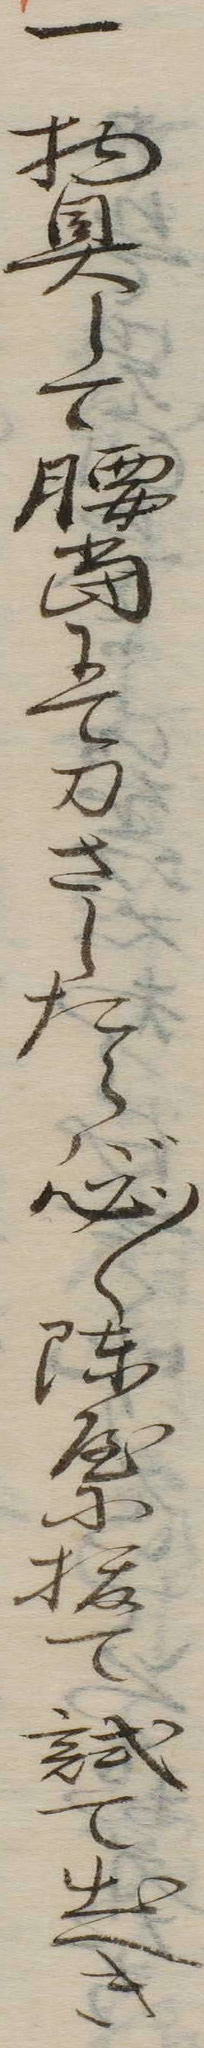一物具して腰当にて刀さしたらば必〳〵陣屋に抜て試て出へき
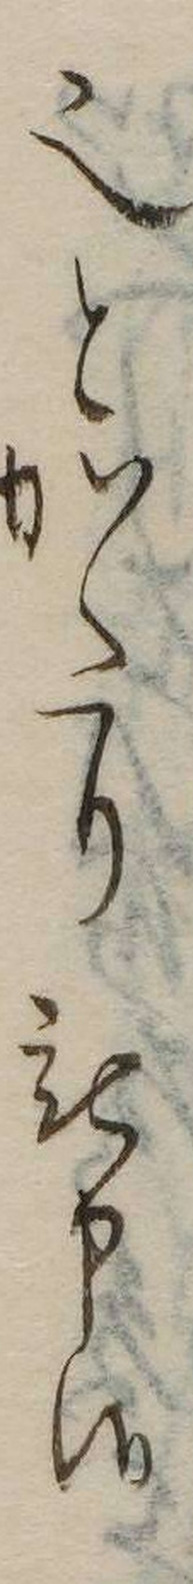也とかたり被申候
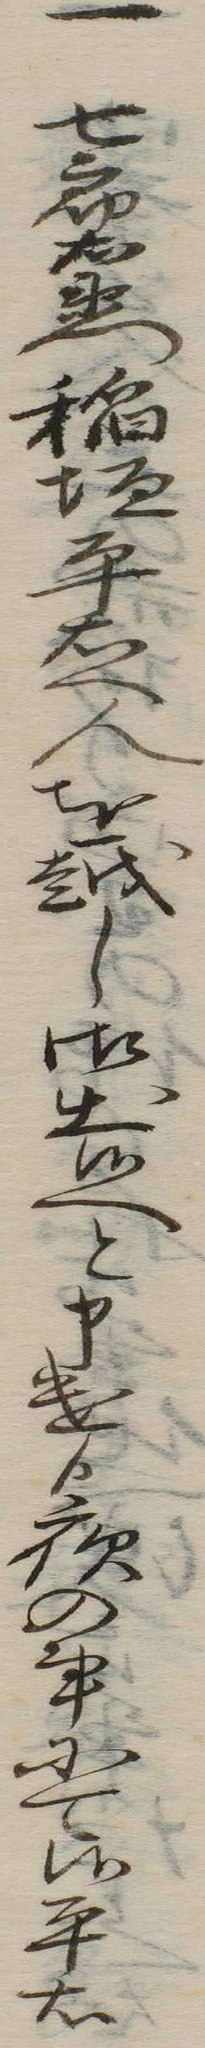一七郎右衛門稲垣平右へんを越し御出候へと申遣候夜の事にて候平右
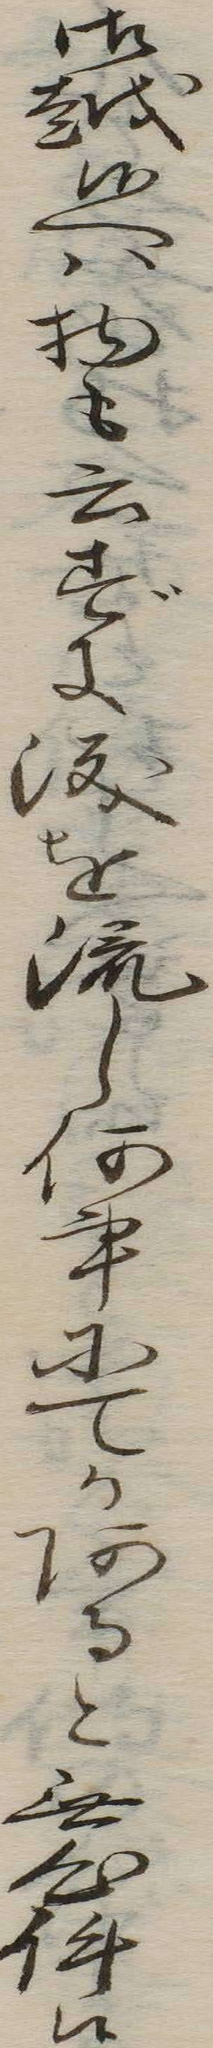御越候へは物も云ずに涙を流し何事にてかあると無心件候
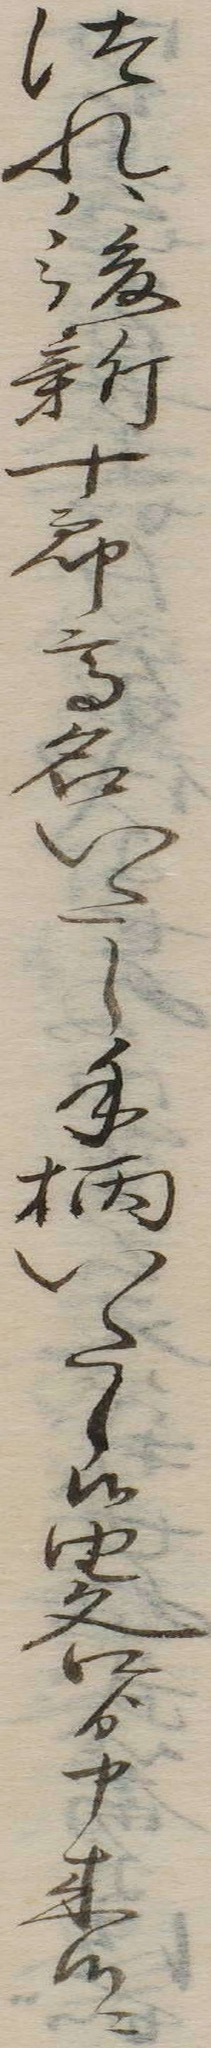つれは後新十郎高名いたし手柄いたし候由各ゟ申来候ニ
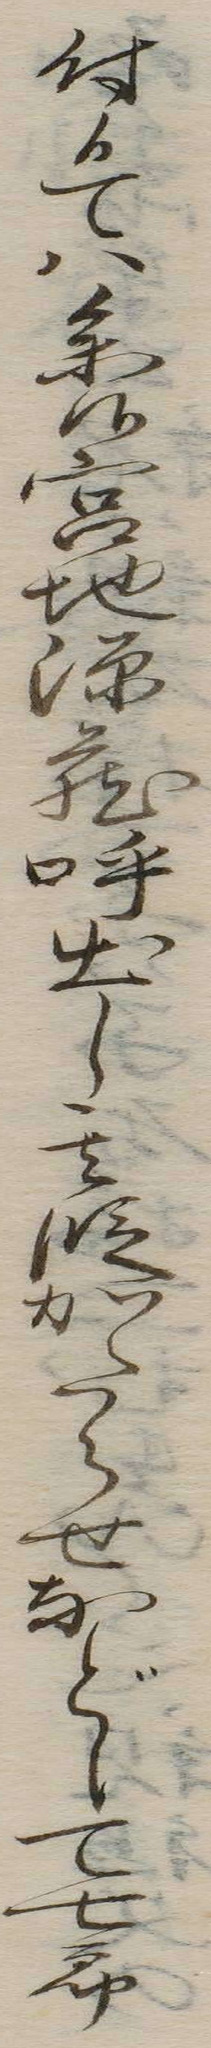付候ては参候宮地源蔵呼出し其段かたらせなどして七郎
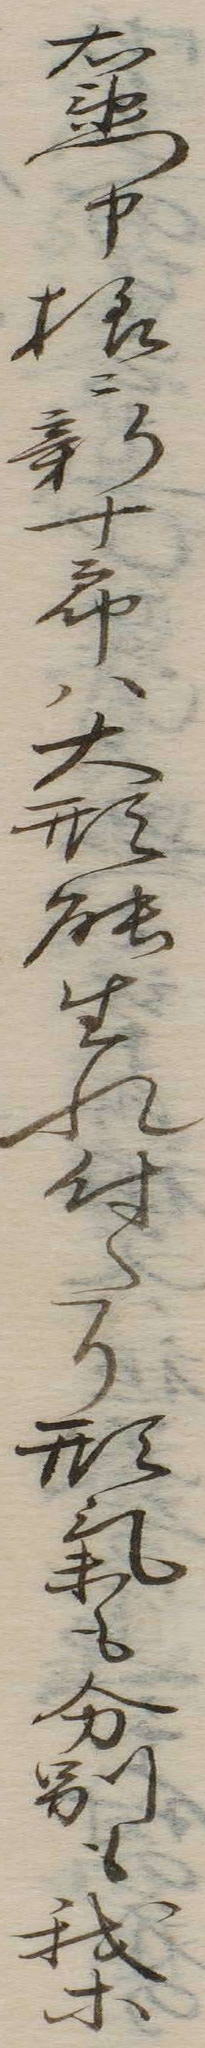右衛門申様ニ新十郎は大形能生れ付たり形気も分別も我等
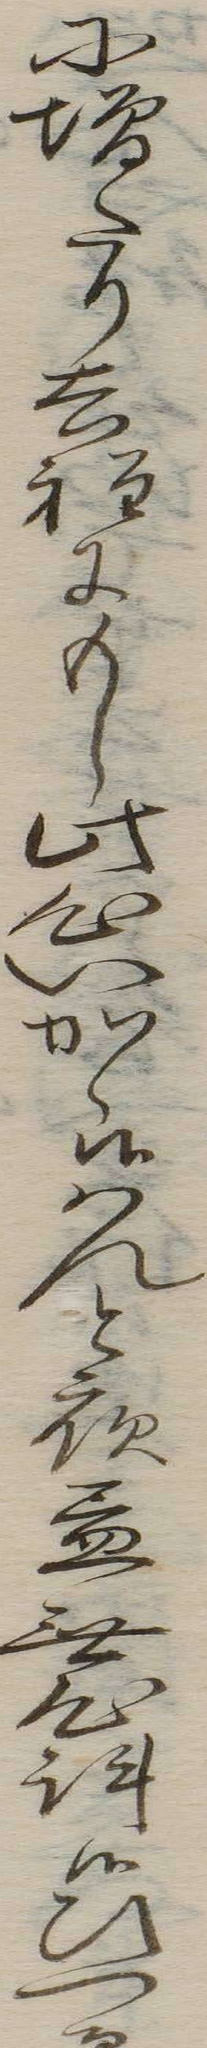に増たり去程にもし此心いかゝ候はんと夜昼無心計候ひつる
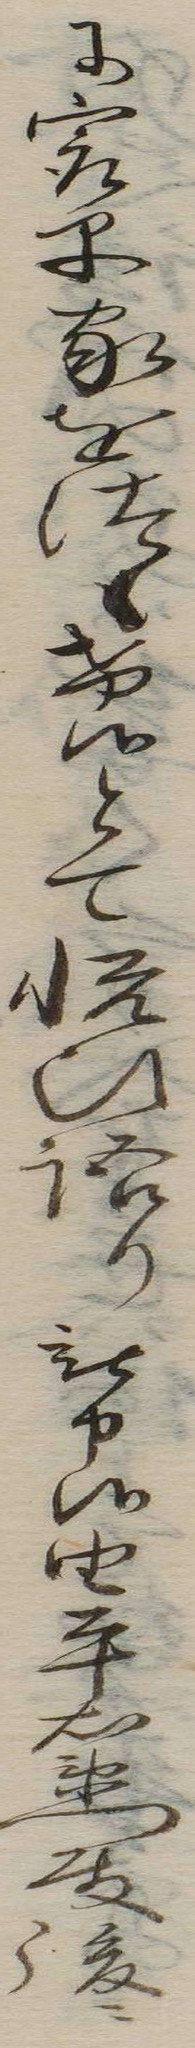に最早家をつゝけ候とて悦ひ語り被申候由平右衛門殿後ニ
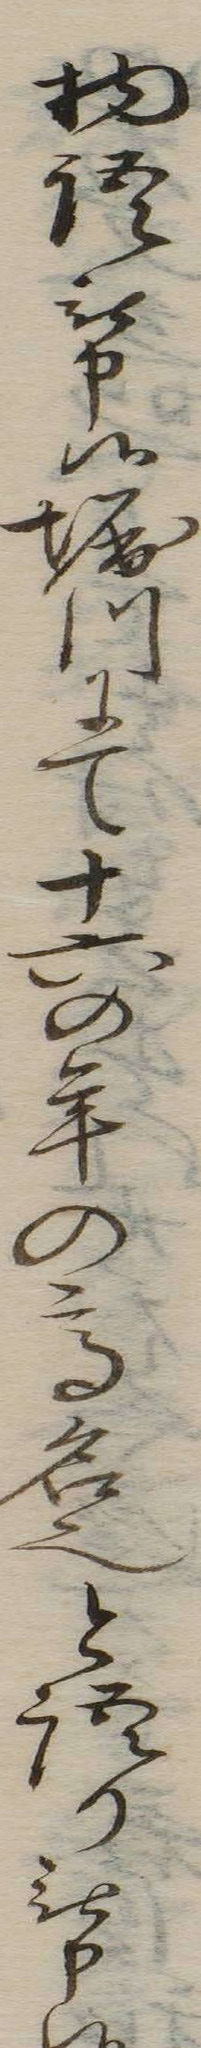物語被申候堀川にて十六の年の高名也と語り被申候
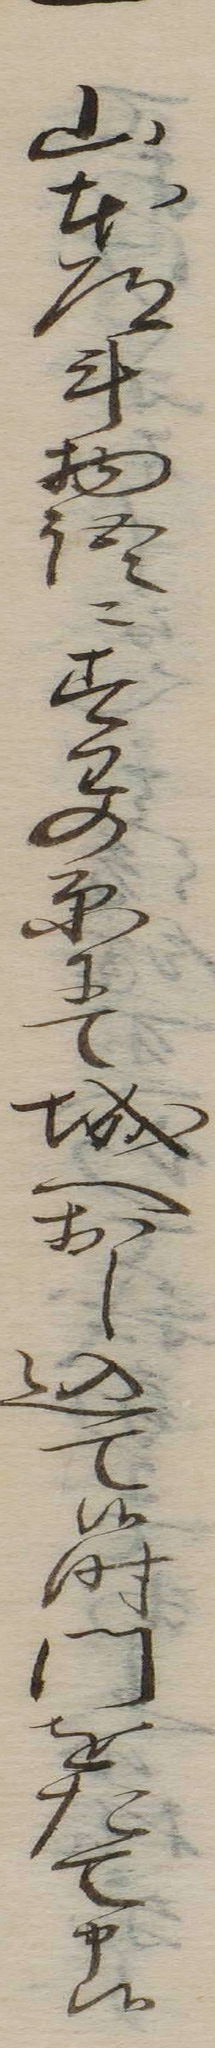一山本道斗物語ニすわの原にて城へおし込て候時門をたて申候
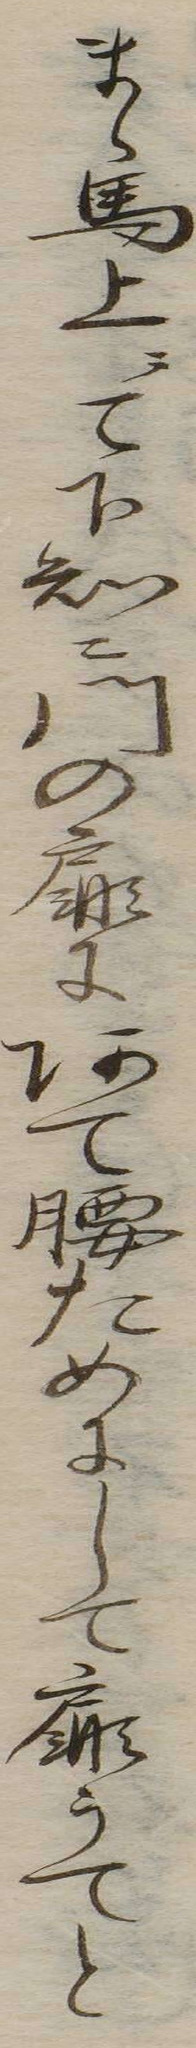まゝ馬上ニて下知ニ門の扉にあて腰ためにして扉うてと
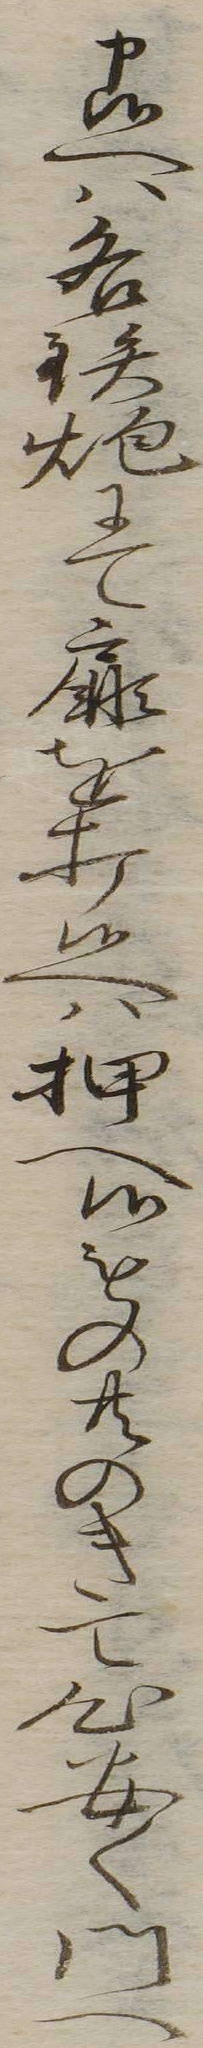申候へは各鉄炮にて扉を打候へは押へ候もの共のきて心安く門へ
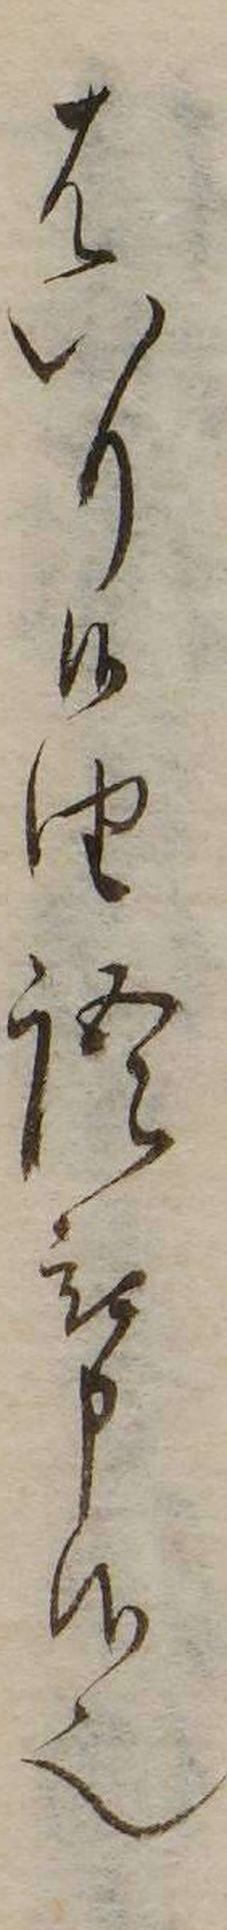はいり候由語被申候也

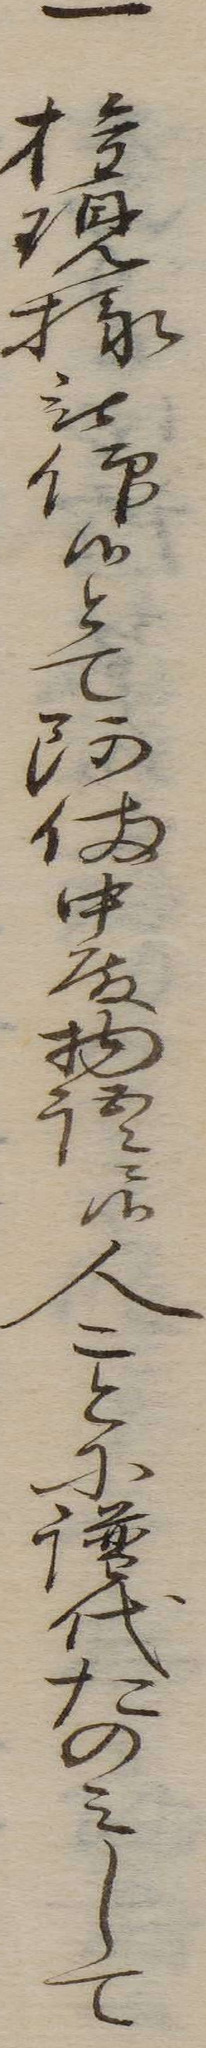一権現様被仰候とて阿備中殿物語ニ候人ことに譜代たのみして
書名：三河之物語
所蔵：国文学研究資料館
